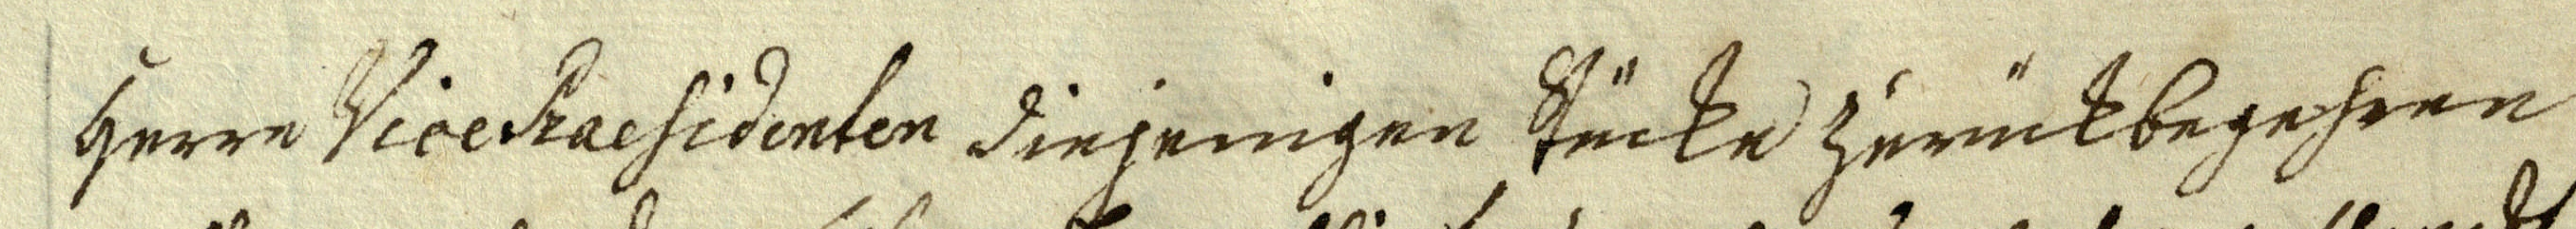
Herrn VicePraesidenten diejenigen Stücke zurückbegehren
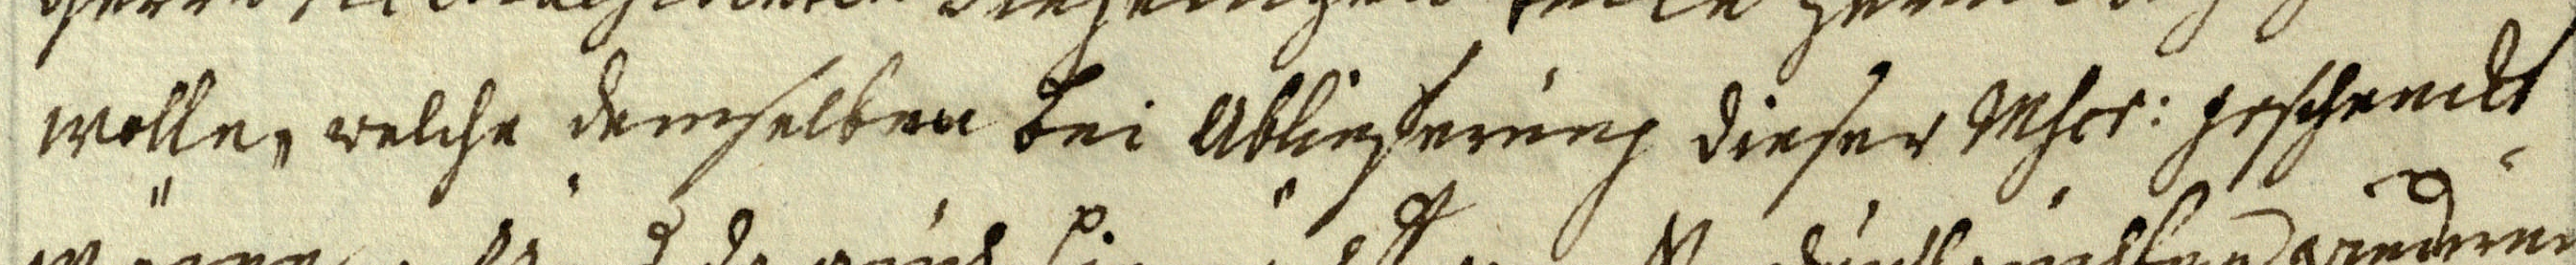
wolle, welche demselben bei Ablieferung dieser Mscr. geschenckt
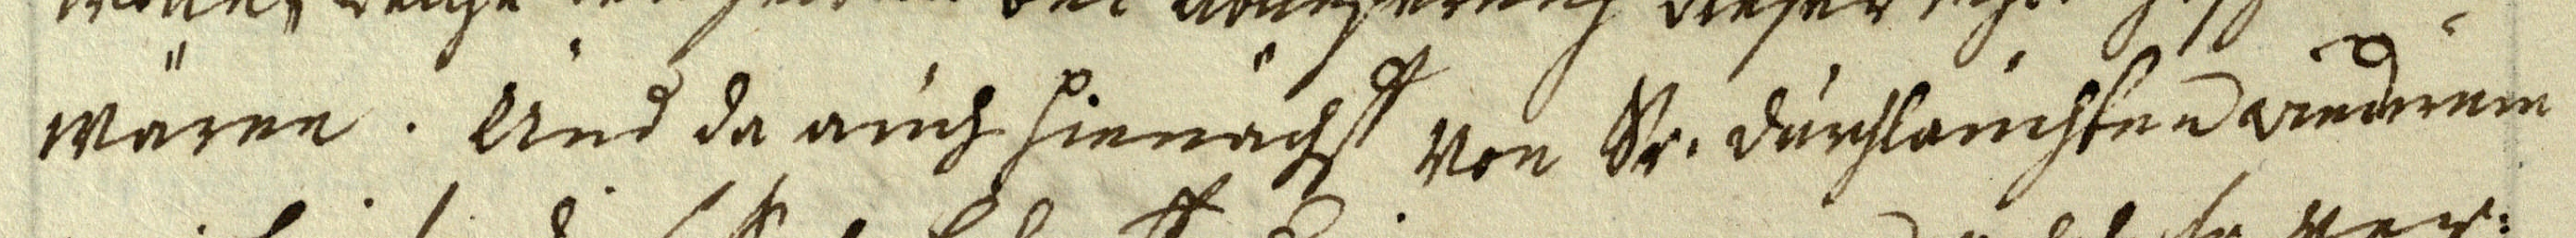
wären. Und da auch hienächst von Sr. Durchlauchten wiederum
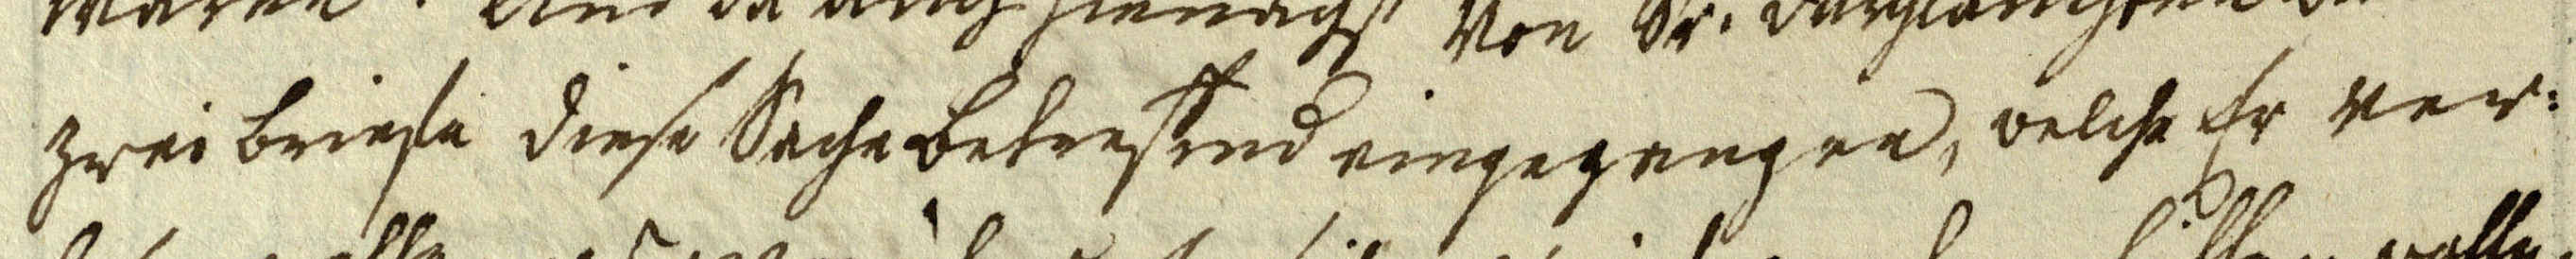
zwei Briefe diese Sache betreffend eingegangen, welche Er ver¬
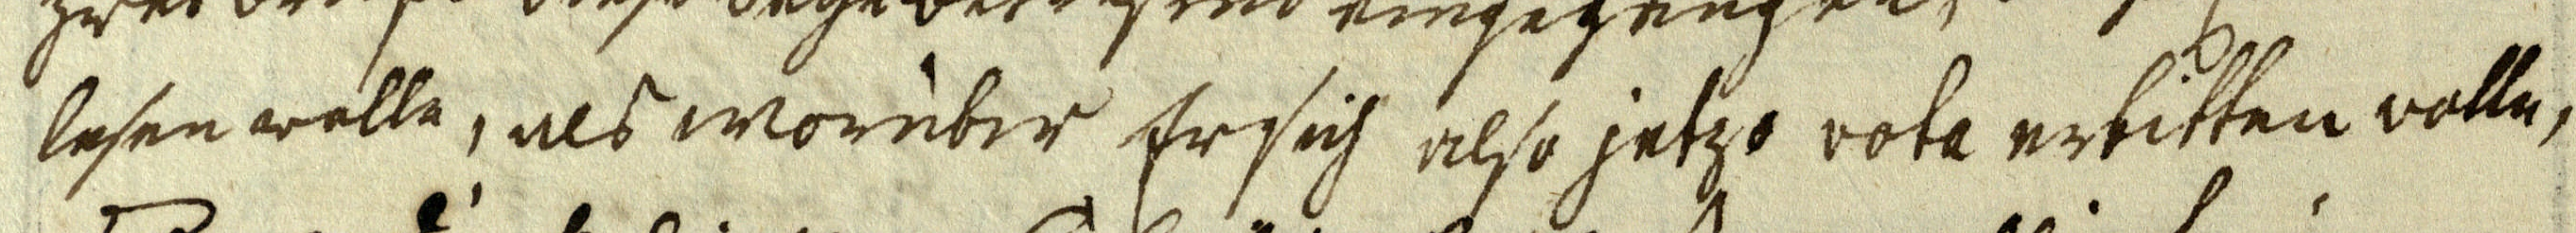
lesen wolle, als worüber Er sich also jetzo vota erbitten wolle,
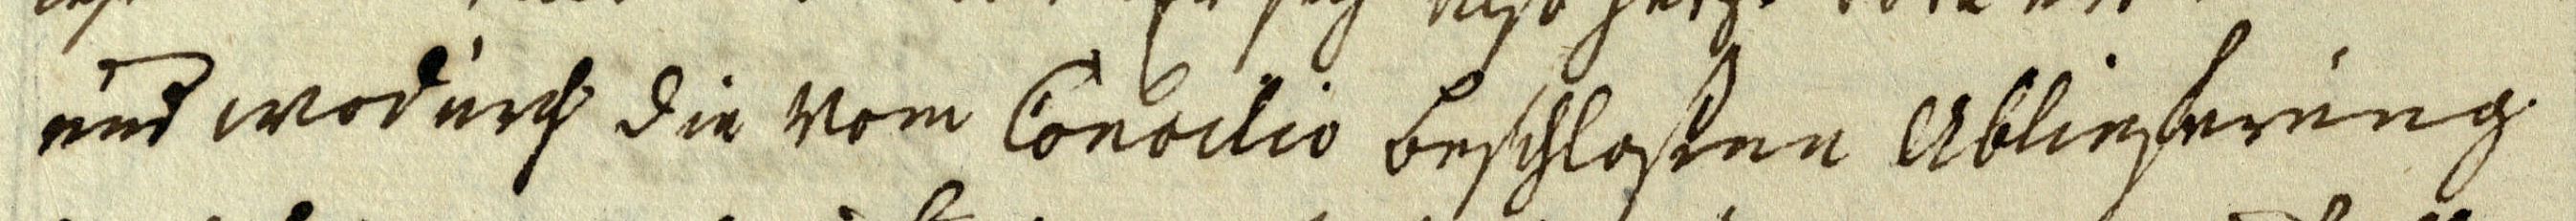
und wodurch die vom Concilio beschloßene Ablieferung
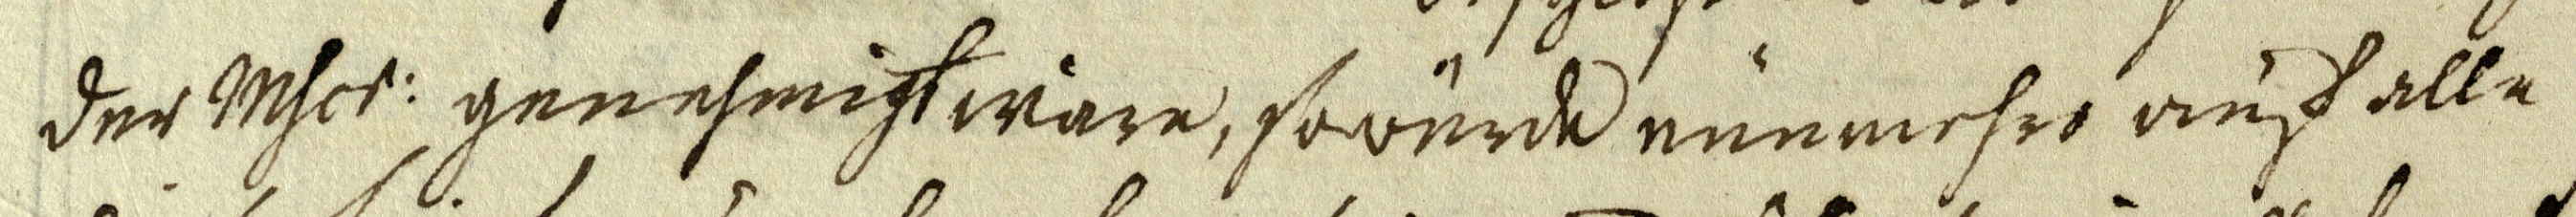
der Mscr. genehmigt wäre, so würde nunmehro auf alle
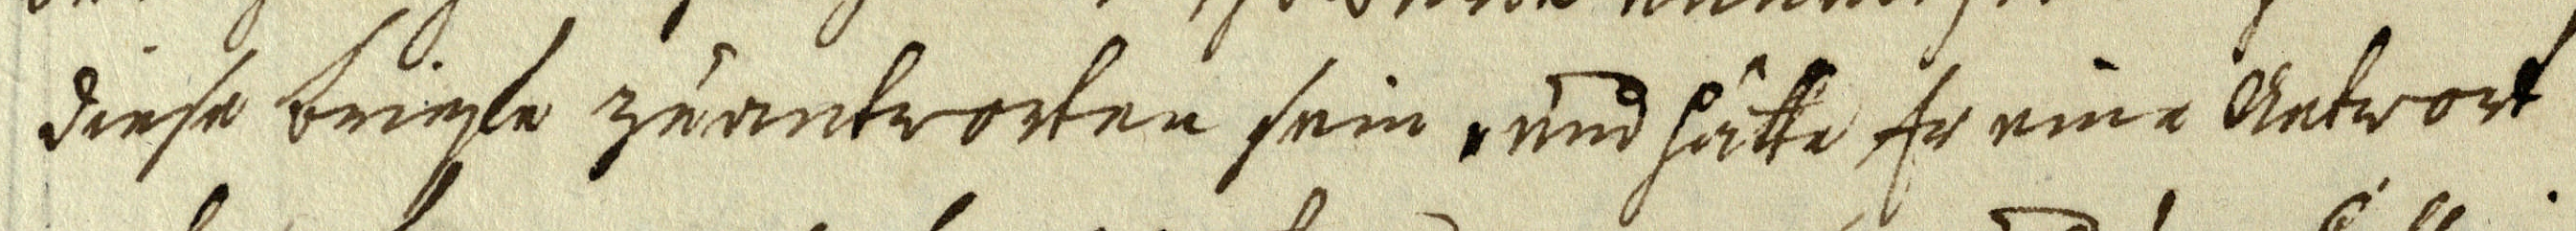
diese Briefe zu antworten sein, und hätte Er eine Antwort
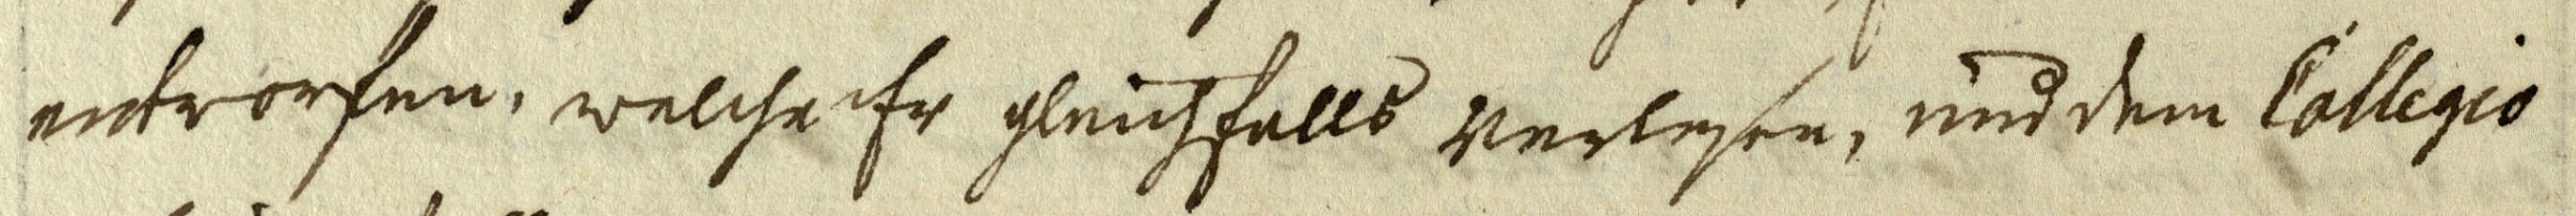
entworfen, welche Er gleichfalls vorlegte, und dem Collegio
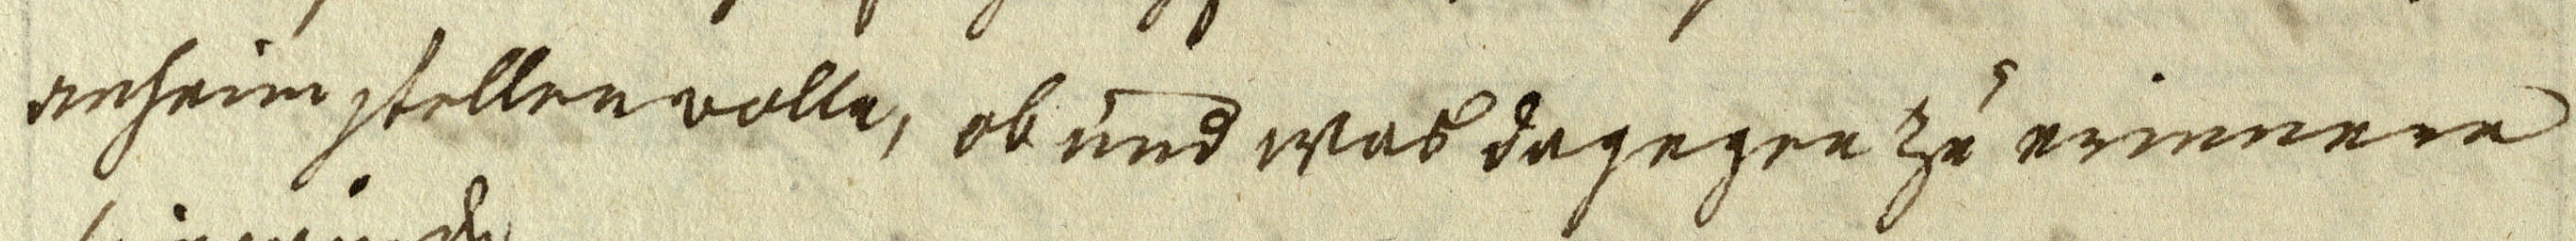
anheim stellen wolte, ob und was dagegen zu erinnern
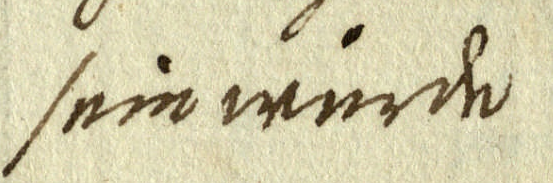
sein würde.
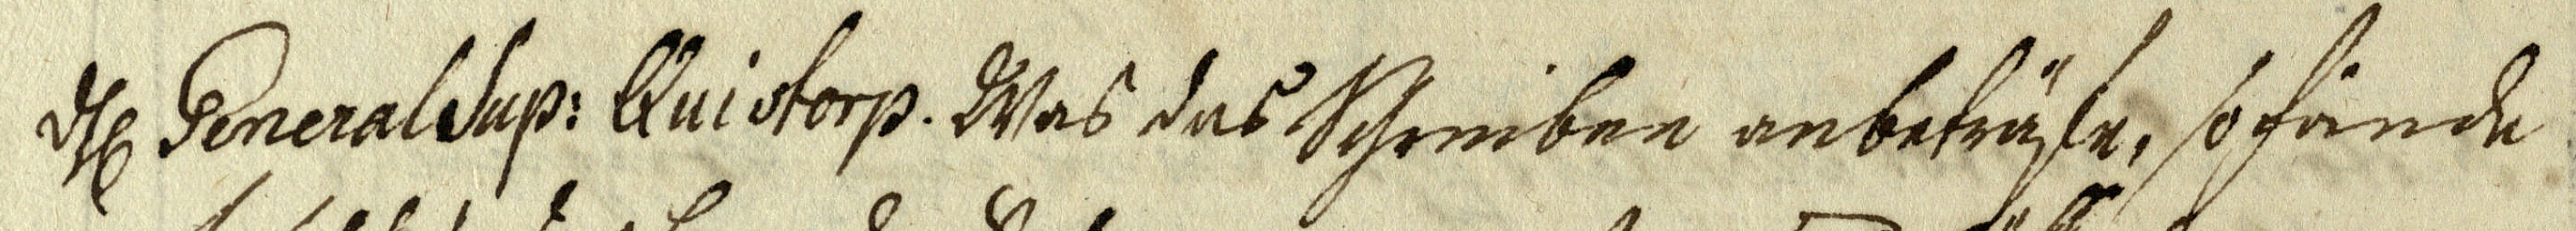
dh GeneralSup. Quistorp. Was das Schreiben anbeträfe, so fände
